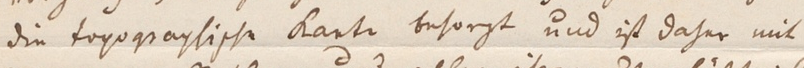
die topgraphische Karte besorgt und ist daher mit
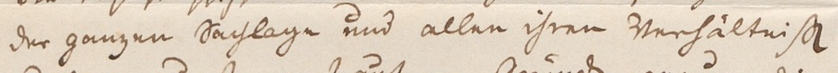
der ganzen Sachlage und allen ihren Verhältnissen
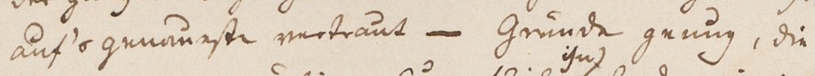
auf's genaueste vertraut – Gründe genug, die
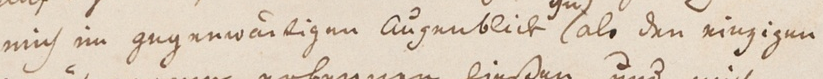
mich im gegenwärtigen Augenblick ihn als den einzigen
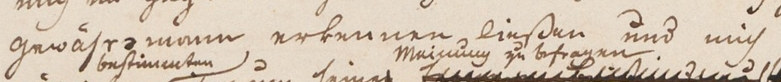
Gewährsmann erkennen ließen und mich
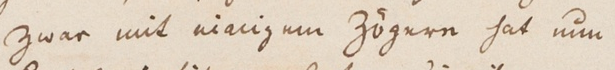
Zwar mit einigem Zögern hat nun
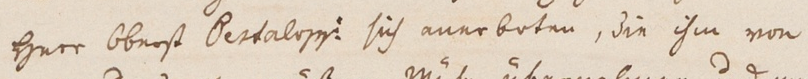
Herr Oberst Pestalozzi sich anerboten, die ihm von
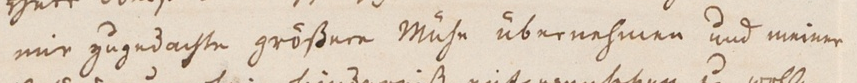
mir zugedachte größere Mühe übernehmen und meiner
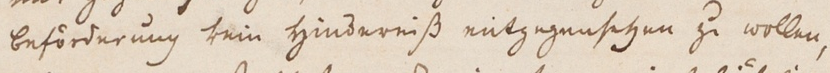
Beförderung kein Hinderniß entgegensetzen zu wollen,
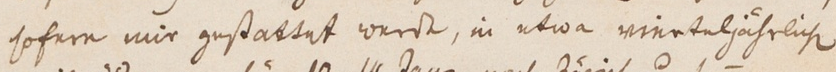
sofern mir gestattet werde, in etwa vierteljährlichen
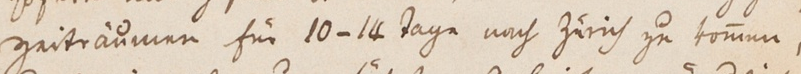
Zeiträumen für 10–14 Tage nach Zürich zu kommen,
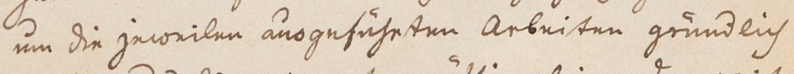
um die jeweilen ausgeführten Arbeiten gründlich
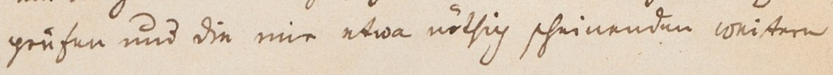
prüfen und die mir etwa nöthig scheinenden weitern
